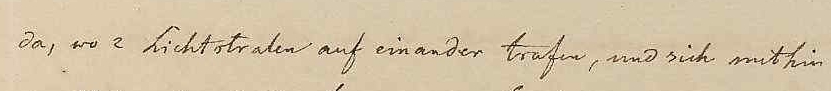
da, wo 2 Lichtstralen auf einander trafen, und sich mithin
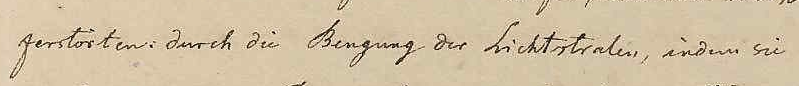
zerstörten: durch die Beugung der Lichtstralen, indem sie
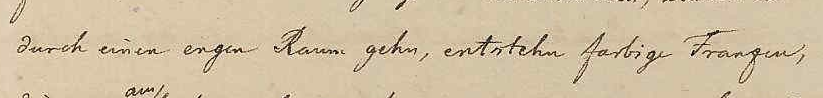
durch einen engen Raum gehn, entstehn farbige Franzen,
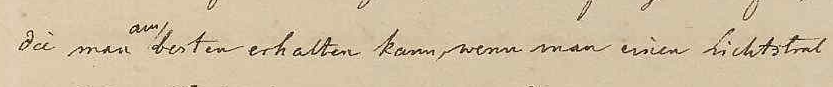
die man am besten erhalten kann, wenn man einen Lichtstral
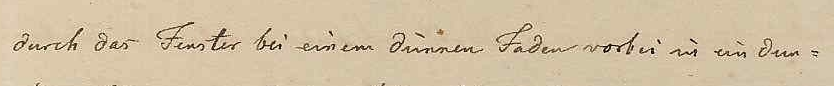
durch das Fenster bei einem dünnen Faden vorbei in ein dun-
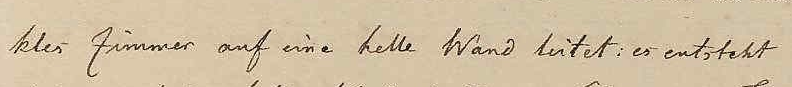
kles Zimmer auf eine helle Wand leitet: es entsteht
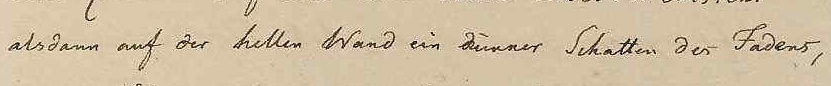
alsdann auf der hellen Wand ein dünner Schatten des Fadens,
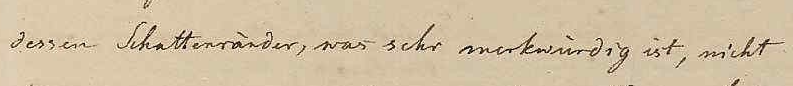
dessen Schattenränder, was sehr merkwürdig ist, nicht
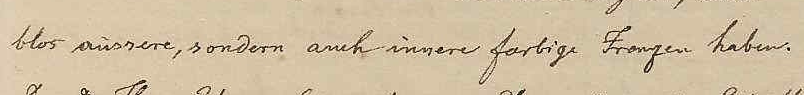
blos äussere, sondern auch innere farbige Franzen haben.
